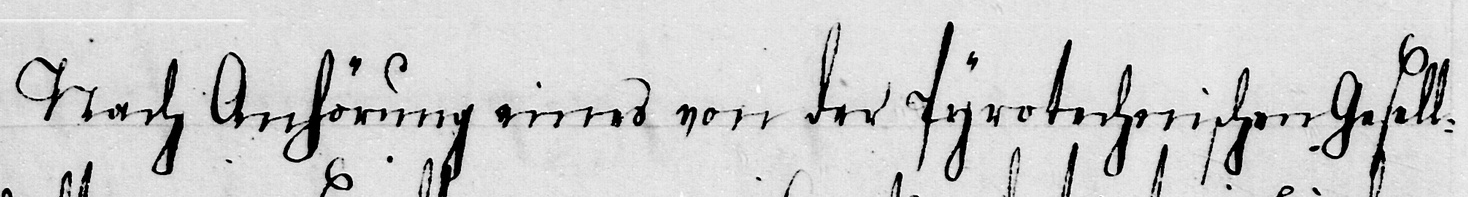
Nach Anhörung eines von der pyrotechnischen Gesell¬
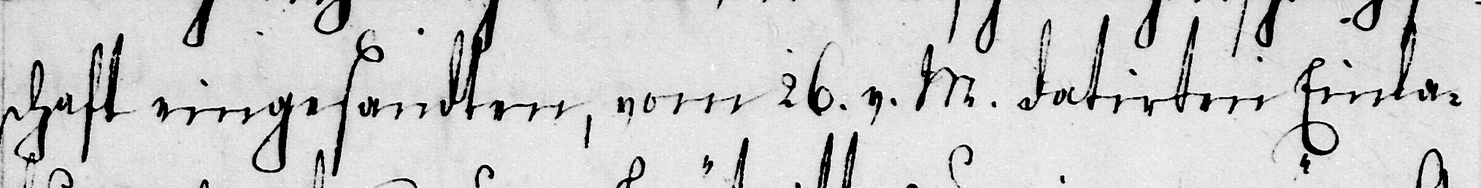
schaft eingesandten, vom 26. v. M. datirten Einla¬
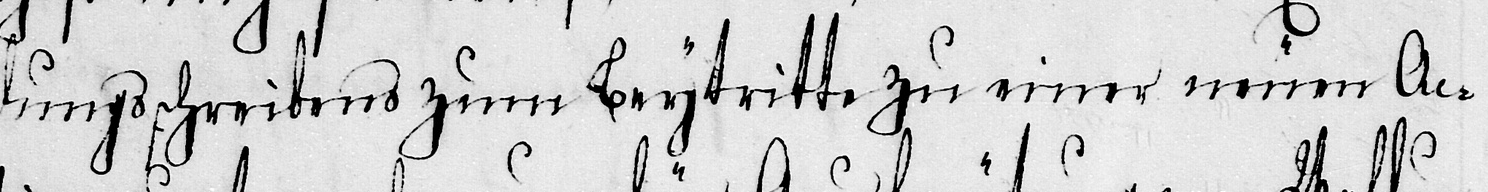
dungsschreibens zum Beytritte zu einer neuen Ac¬
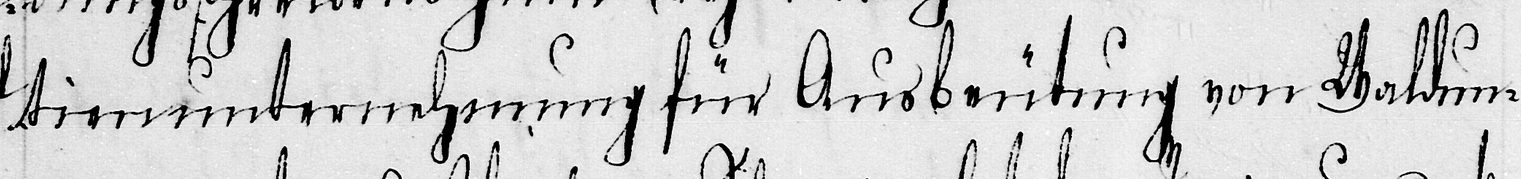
tienunternehmung für Ausbeutung von Waldun¬
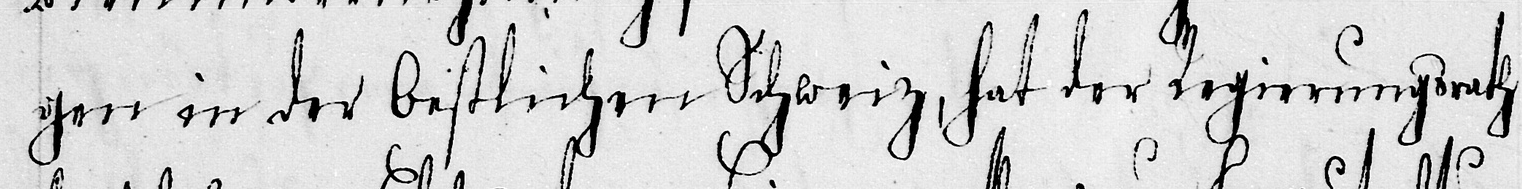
gen in der Oestlichen Schweiz, hat der Regierungsrath
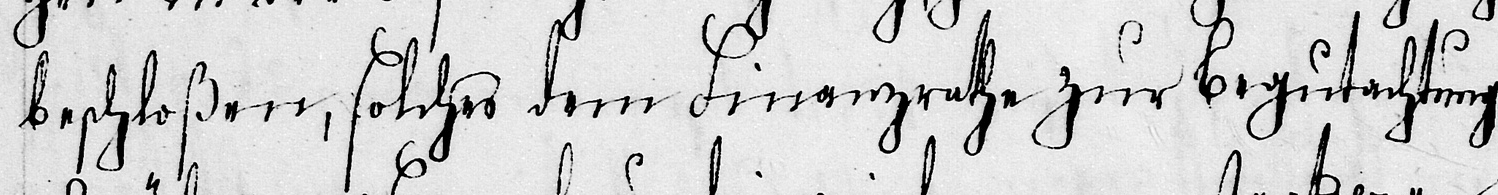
beschloßen, solches dem Finanzrathe zur Begutachtung
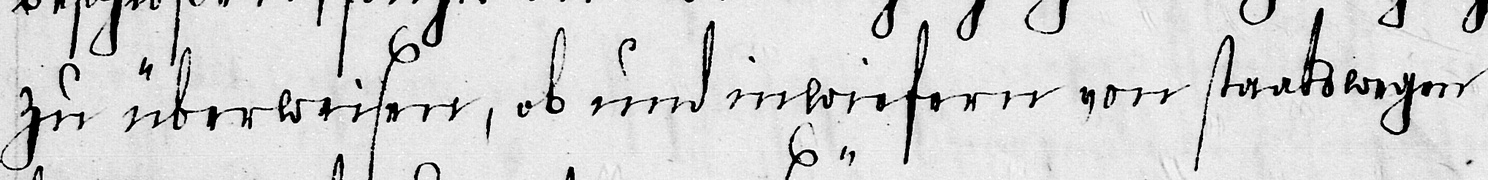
zu überweisen, ob und inwiefern von staatswegen
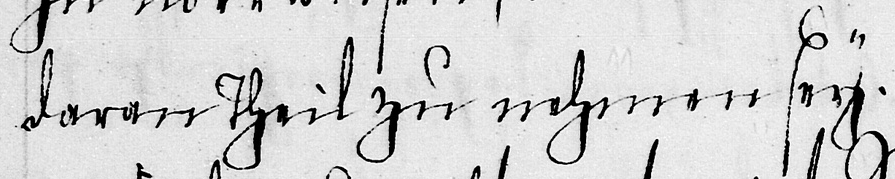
daran Theil zu nehmen sey.
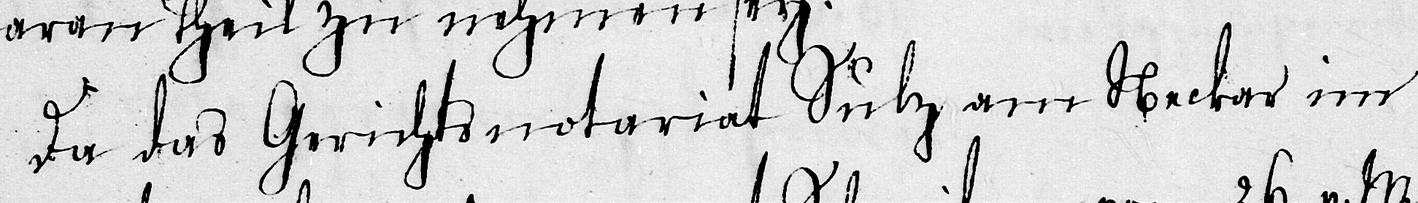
Da das Gerichtsnotariat Sulz am Neckar im
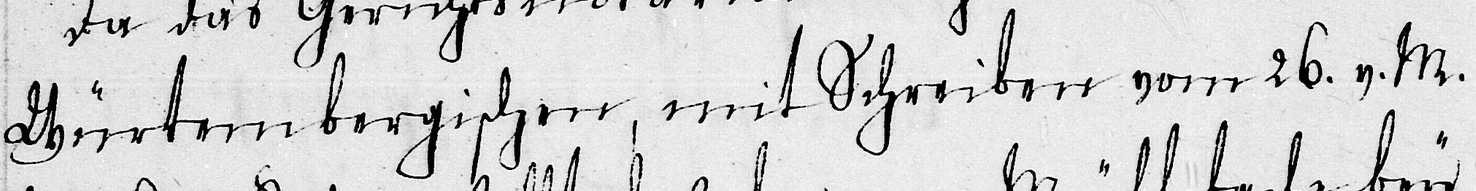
Würtembergischen, mit Schreiben vom 26. v. M.
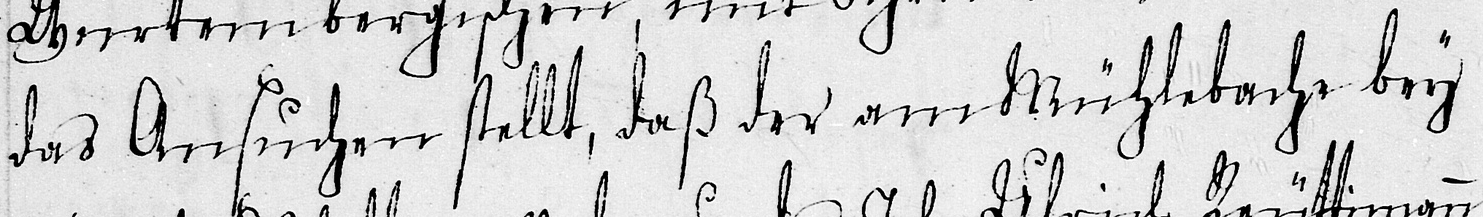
das Ansuchen stellt, daß der am Mühlebache bey
